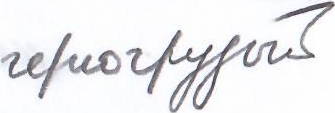черногрудый
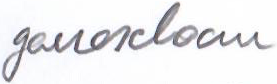долгохвост
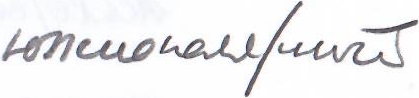южнополярный
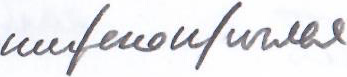ширококрылая
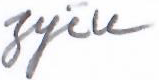зуёк
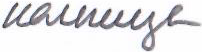колпица
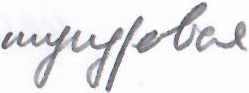тундровая
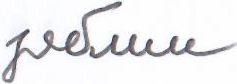зяблик
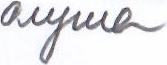олуша
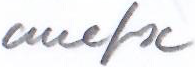стерх
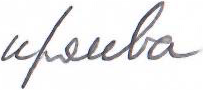кряква
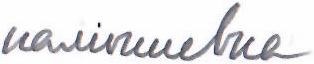камышевка
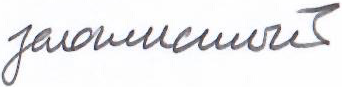залотистый
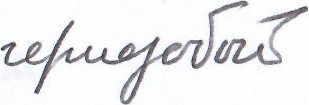чернозобый
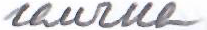гаичка
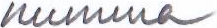питта
